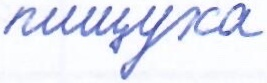пищуха
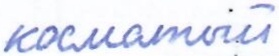косматый
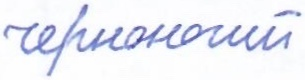черноногий
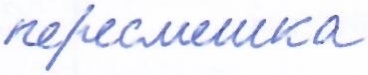пересмешка
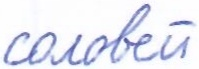соловей
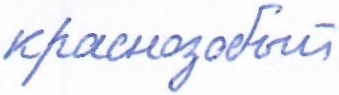краснозобый
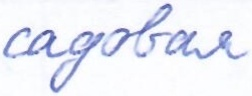садовая
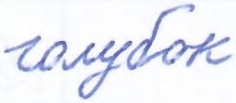голубок
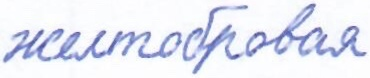желтобровая
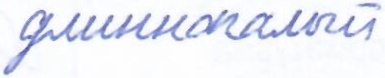длиннопалый
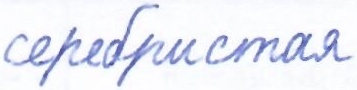серебристая
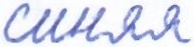синяя
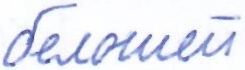белошей
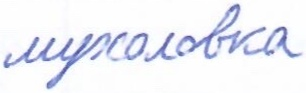мухоловка
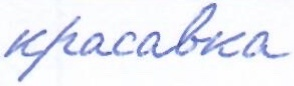красавка
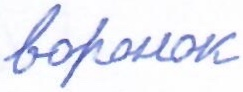воронок
